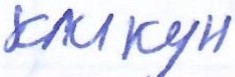кликун
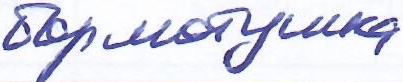бормотушка
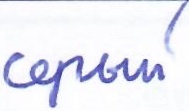серый
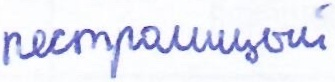пестролицый
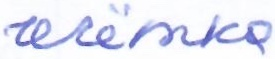чечётка
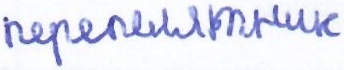перепелятник
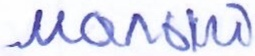малый
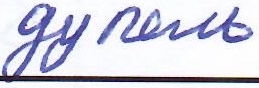дупель
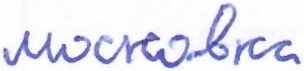московка
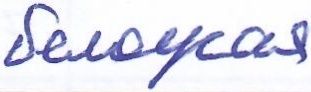белоусая
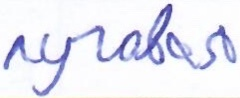лугавая
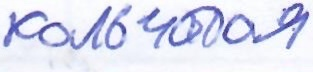кольчатая
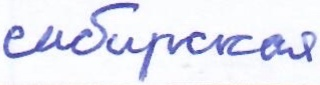сибирская
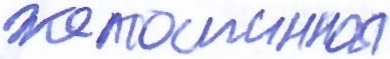желтоспинная
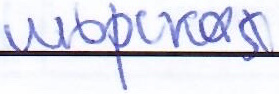морская
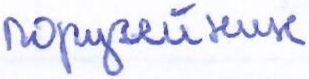поручейник
